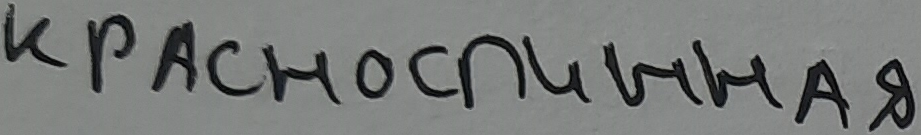красноспинная
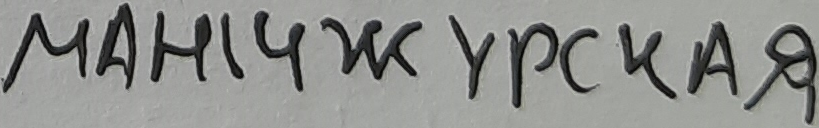маньчжурская
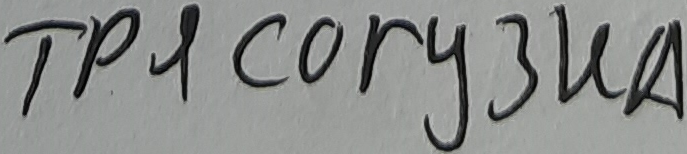трясогузка
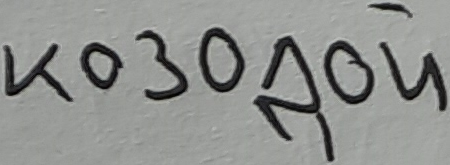козодой
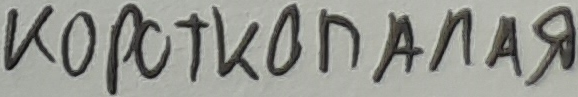короткопалая
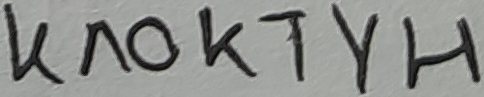клоктун
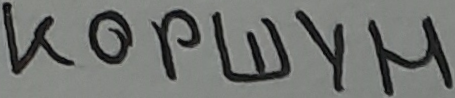коршун
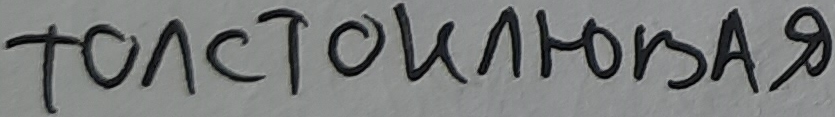толстоклювая
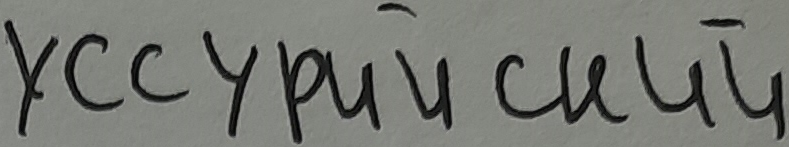уссурийский
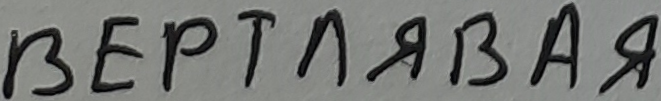вертлявая
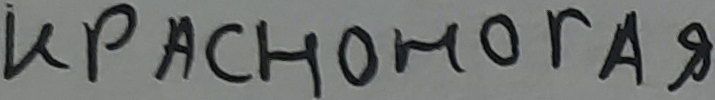красноногая
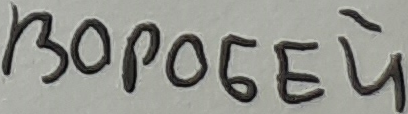воробей
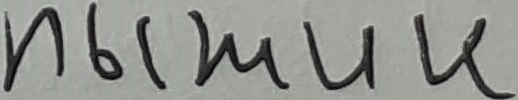пыжик
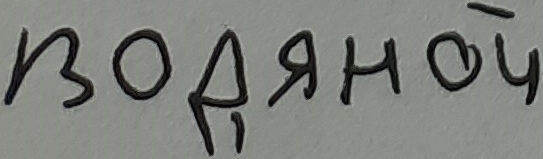водяной
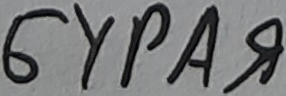бурая
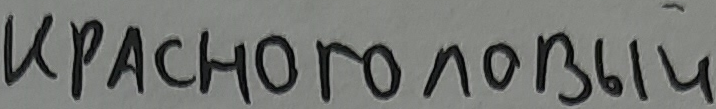красноголовый
